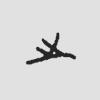之
